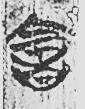會
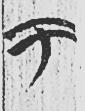于
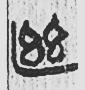{𠃊𢆶}
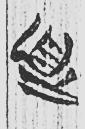{首止}
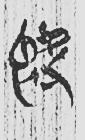既
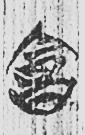會
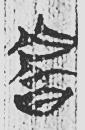者
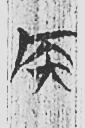侯
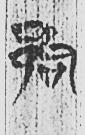邭
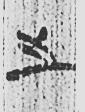之
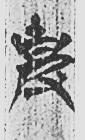尅
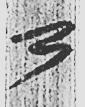乃
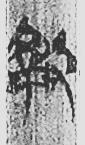{幸攴}
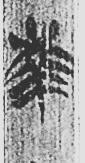南
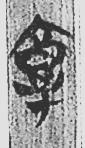𩫏
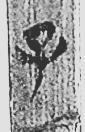子
